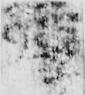○（复）
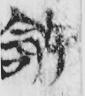○（令）
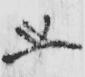之
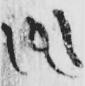州
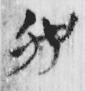加
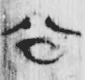公
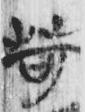苛
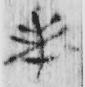未
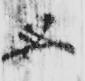之
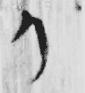人
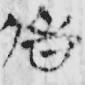俈
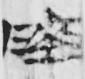陵
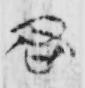君
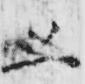之
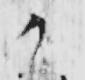人
